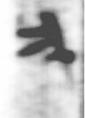凡
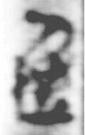○（路）
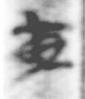車
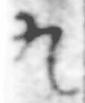九
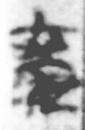𨍱（乘）
